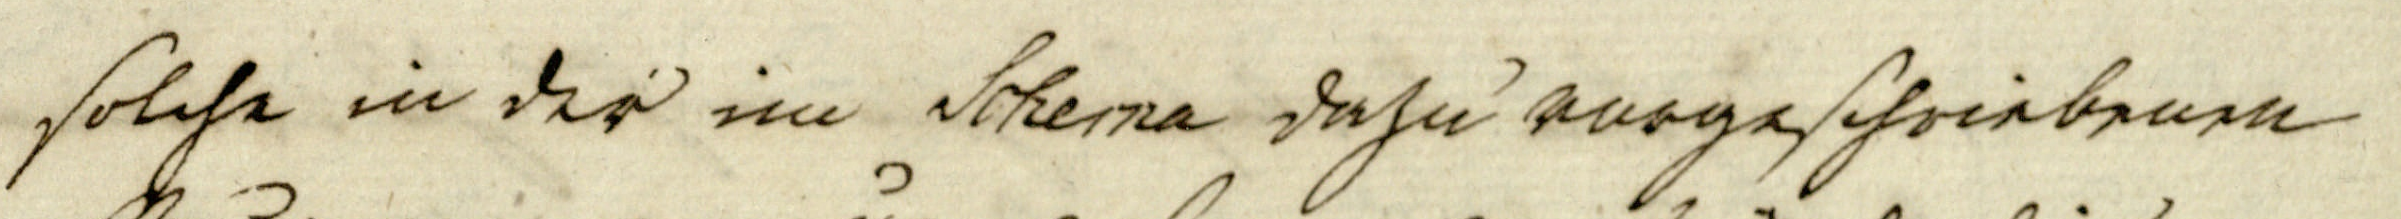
solche in der im Schema dazu vorgeschriebenen
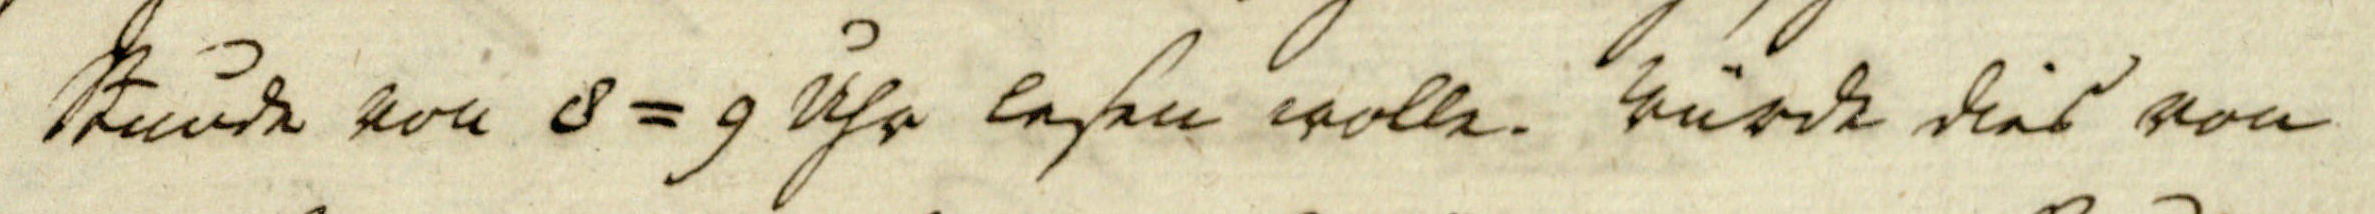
Stunde von 8-9 Uhr lesen wolle. Würde dies von
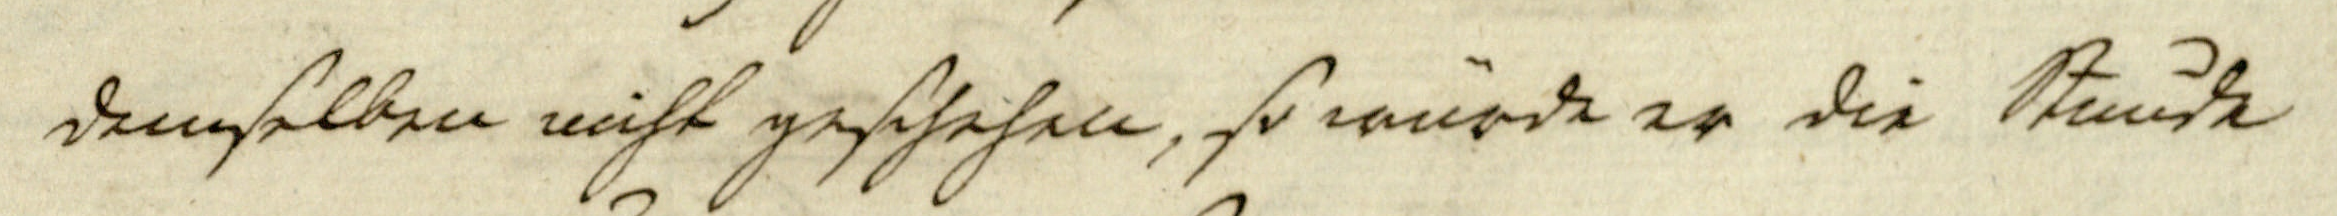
demselben nicht geschehen, so würde er die Stunde
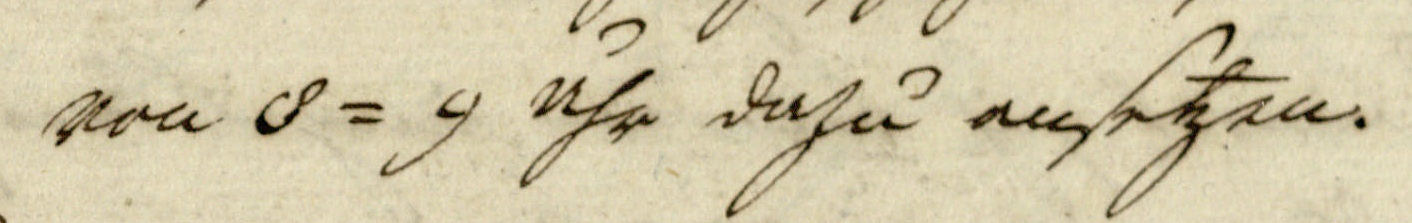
von 8-9 Uhr dazu ansetzen.
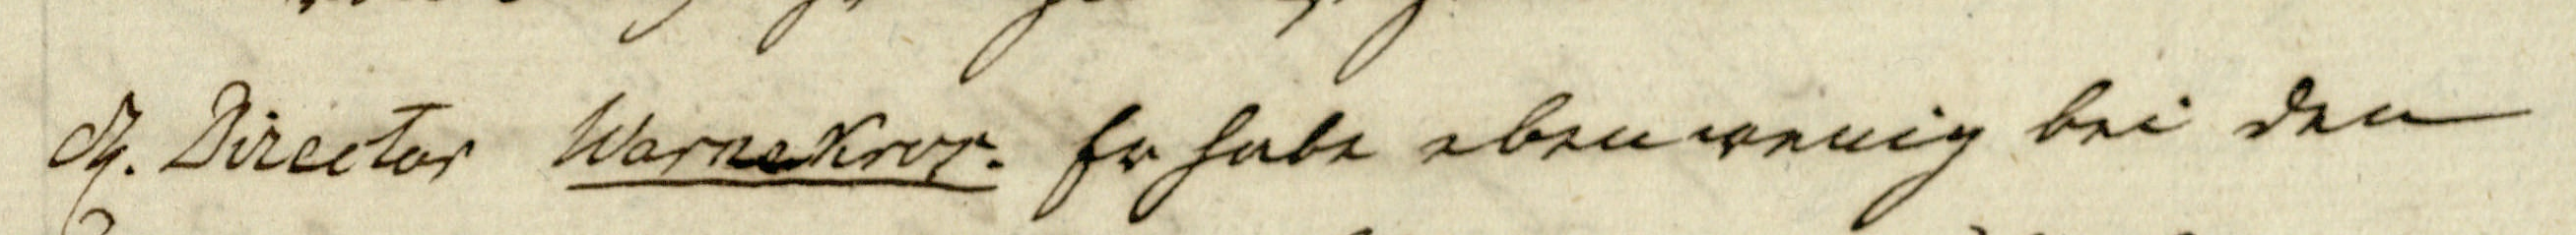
dh. Director Warnekros. Er habe eben wenig bei den
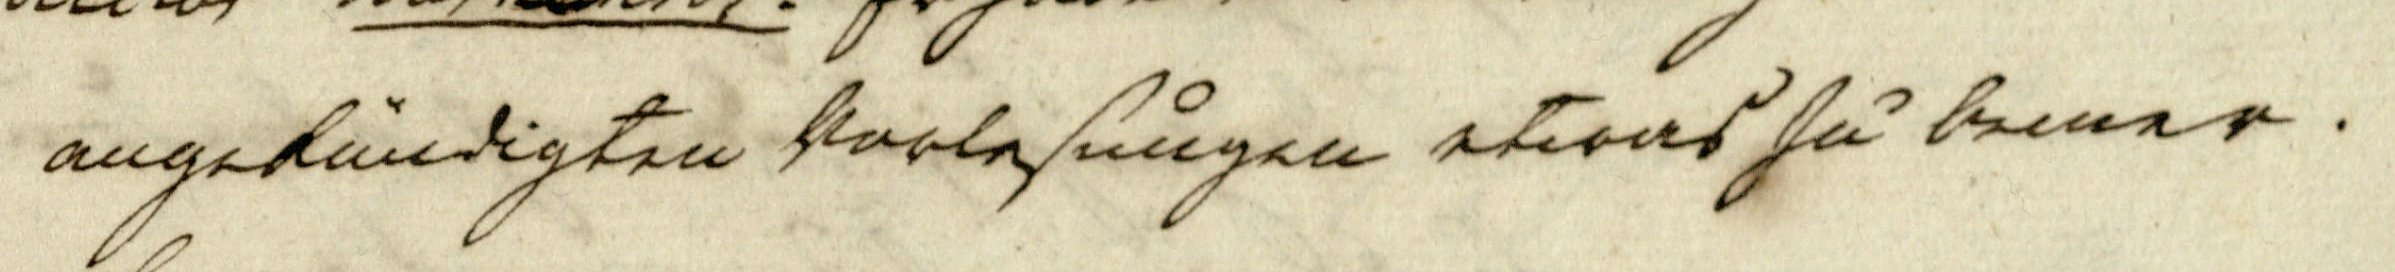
angekündigten Vorlesungen etwas zu bemer¬
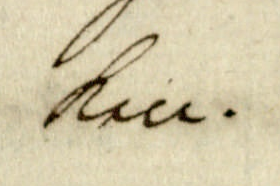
ken.
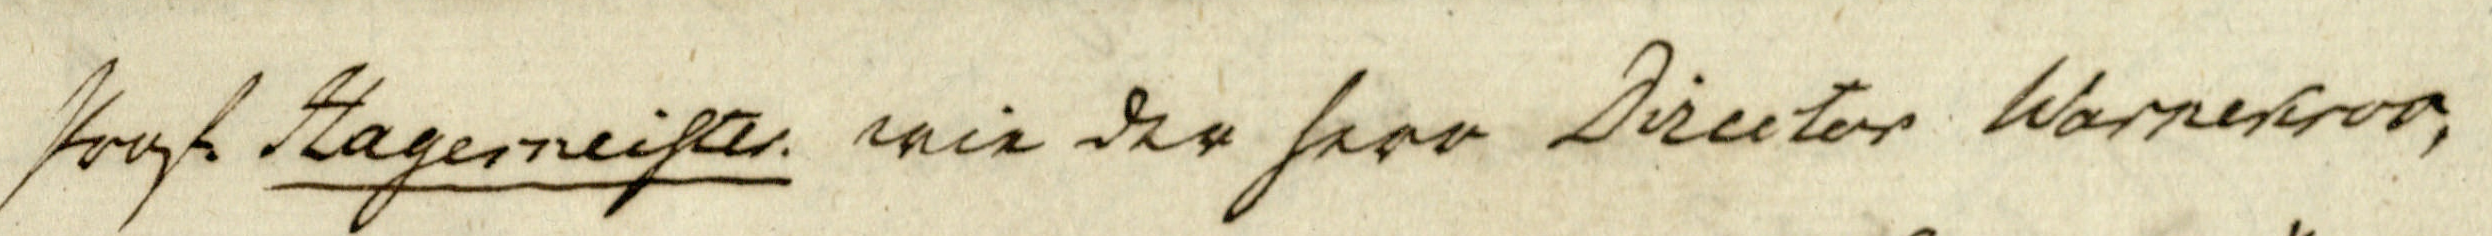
Prof. Hagemeister wie der herr Director Warnekros,
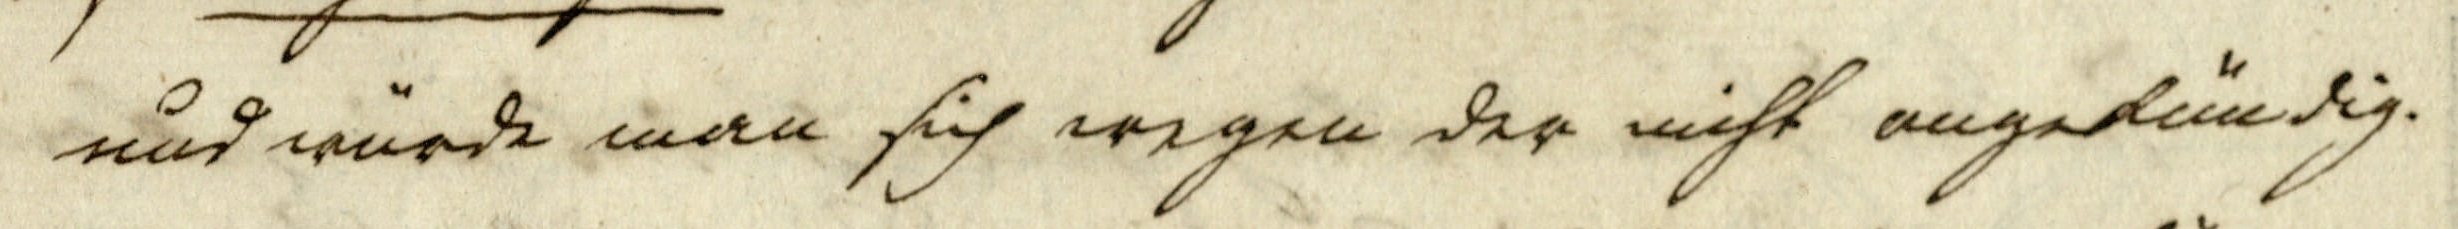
und würde man sich wegen der nicht angekündig¬
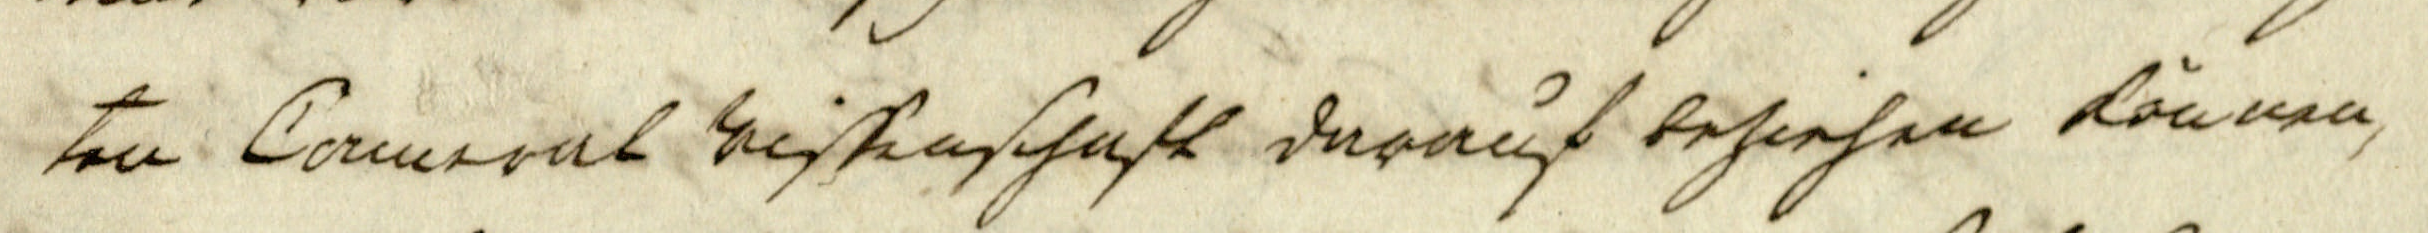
ten Cameral Wissenschaft darauf beziehen können,
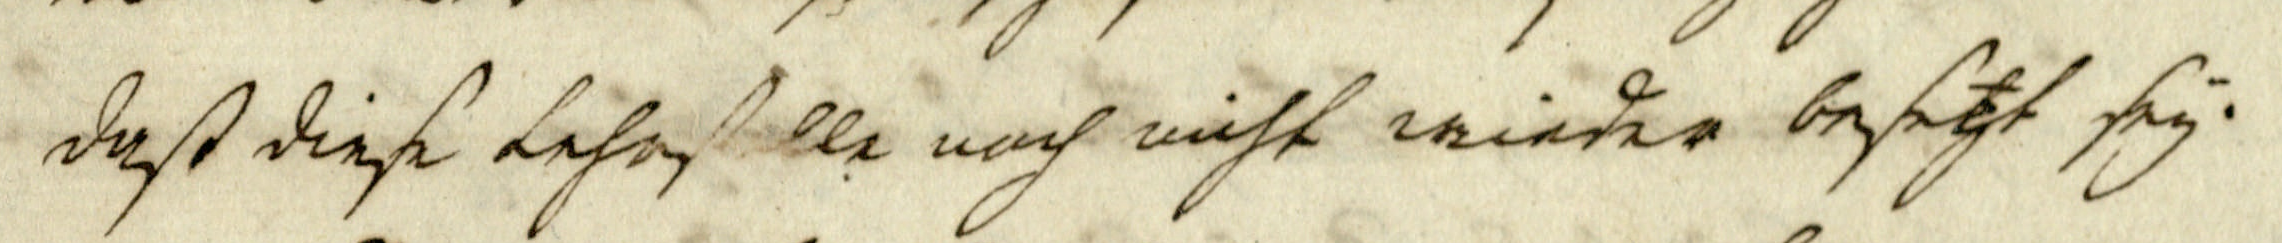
daß diese Lehrstelle noch nicht wieder besetzt seÿ.
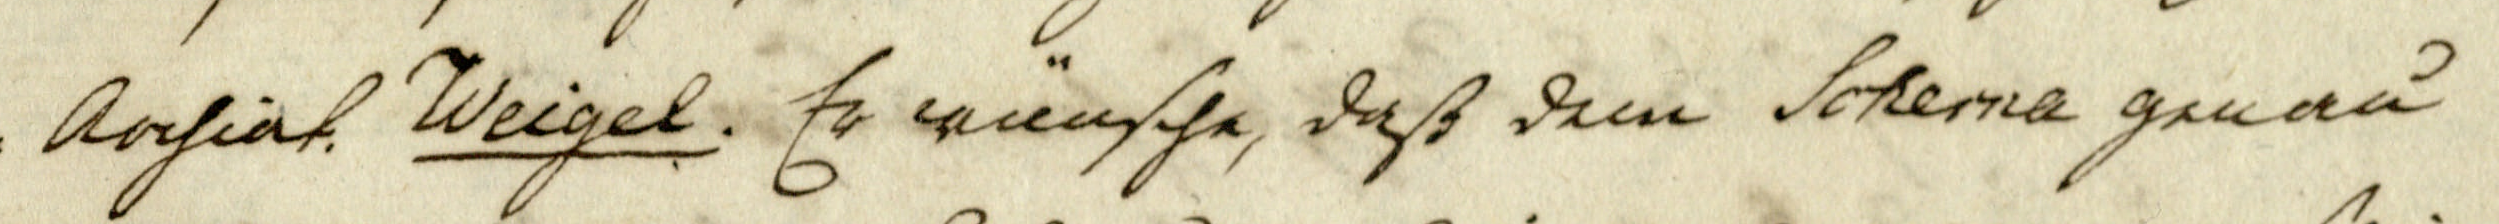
Archiat. Weigel. Er wünsche, daß dem Schema genau
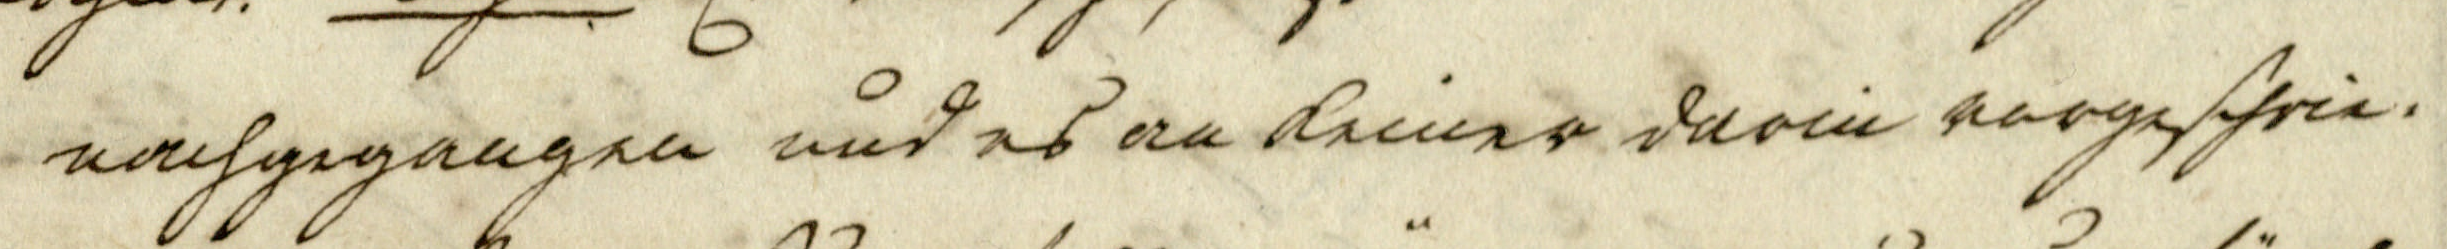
nachgegangen und es an keiner darin vorgeschrie¬
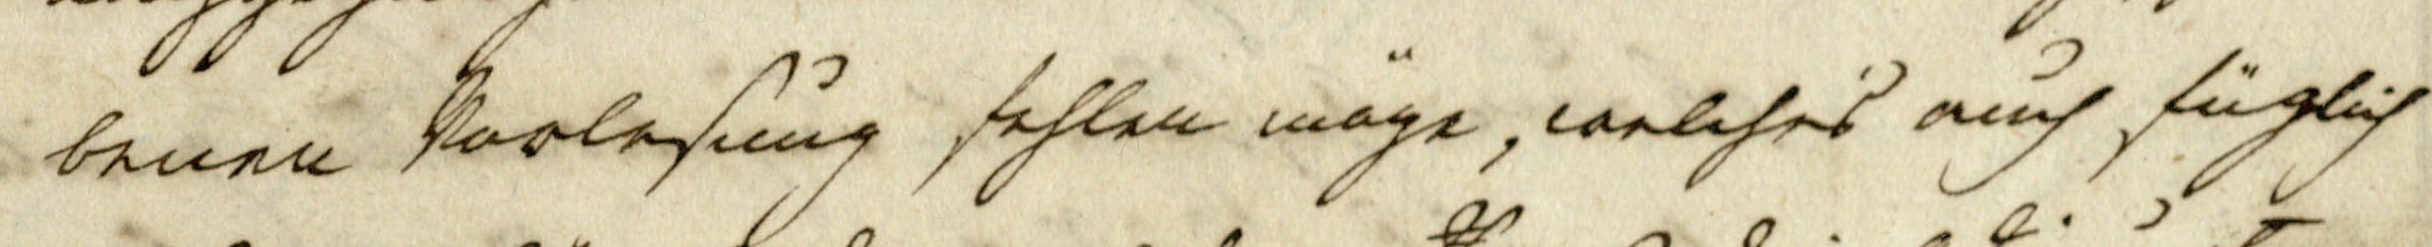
benen Vorlesung fehlen möge, welches auch füglich
